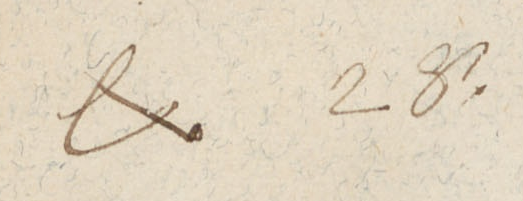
l. 28.
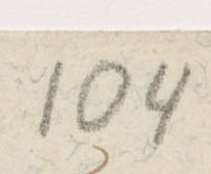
104
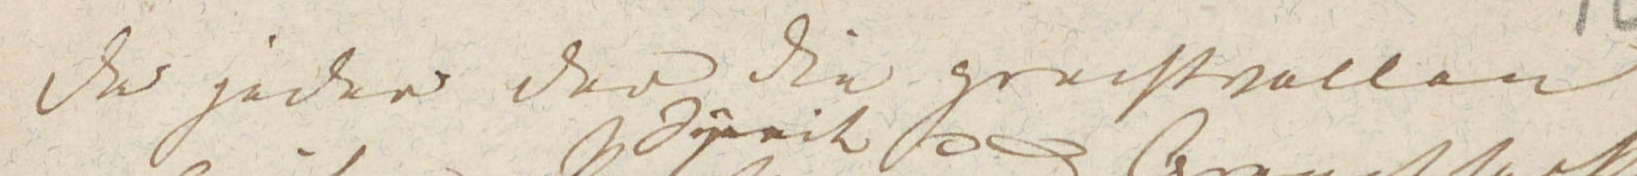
der jeder der die prachtvollen
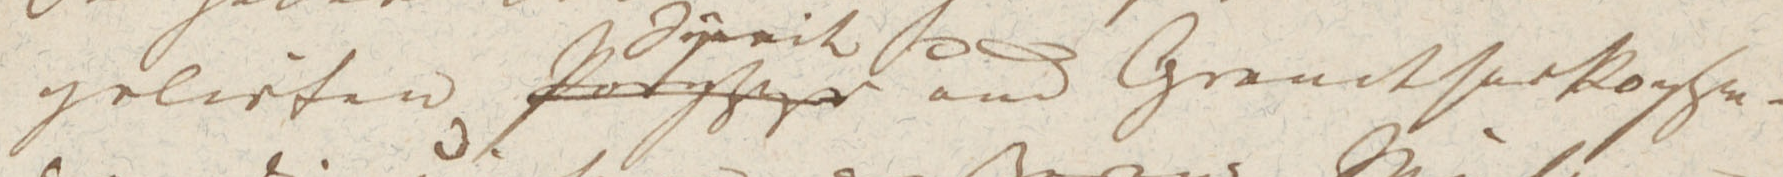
polirten Porphyr Syenit und Granitsarkopha-
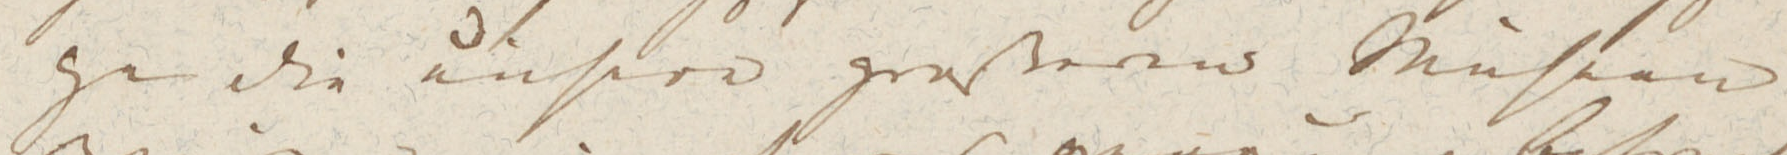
ge die unsere grosseren Museen
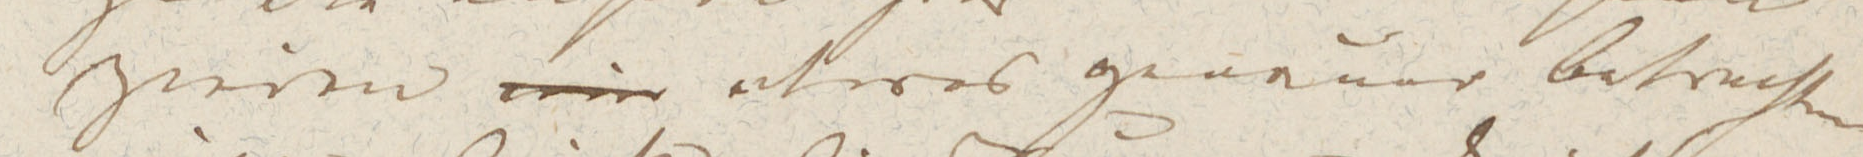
zieren ein etwas genauer betrachten
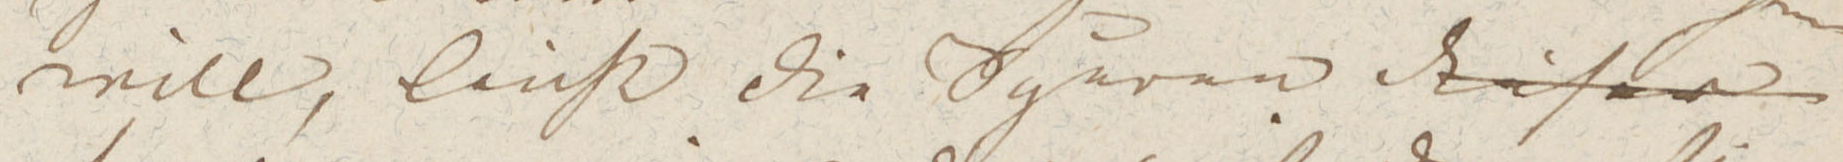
will, leicht die Spuren dieser
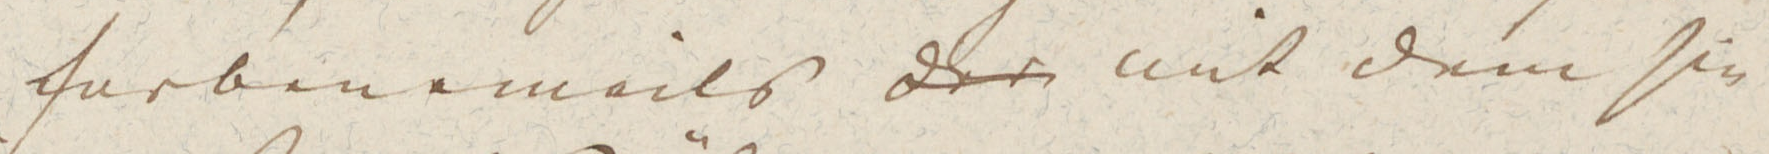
Farbenemails der mit dem sie
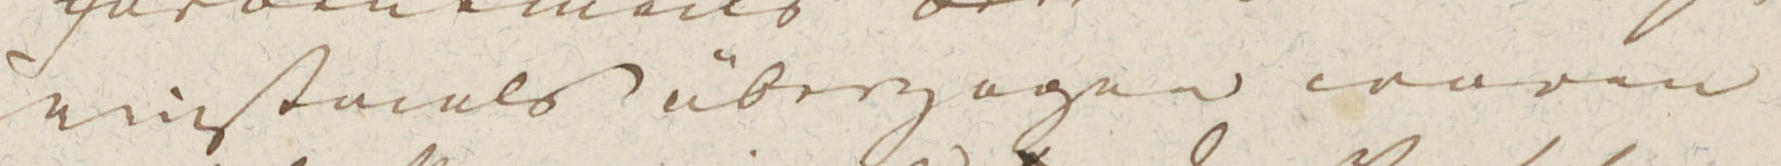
einstmals überzogen waren
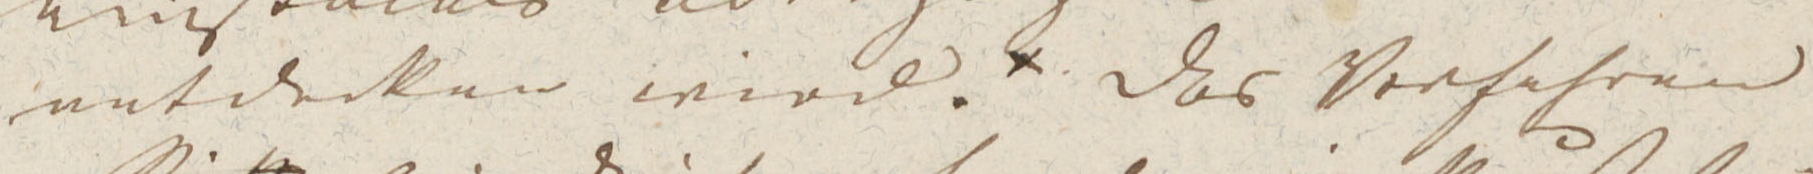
entdecken wird. % Das Verfahren
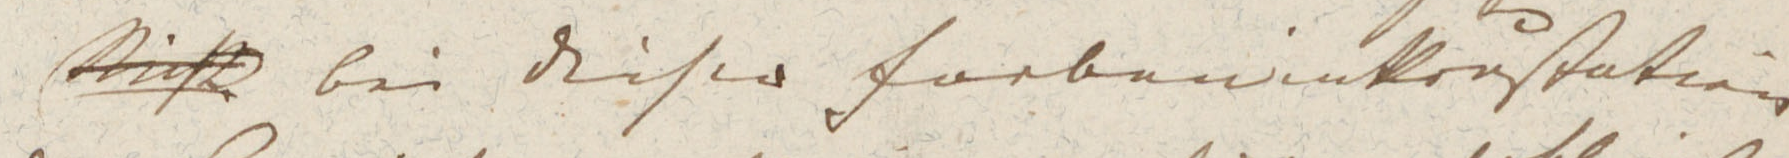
Nicht bei dieser Farbeninkrustation
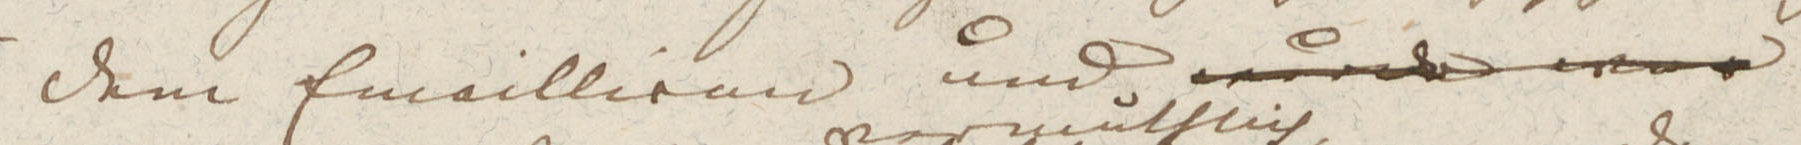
dem Emailliren und wurde vor
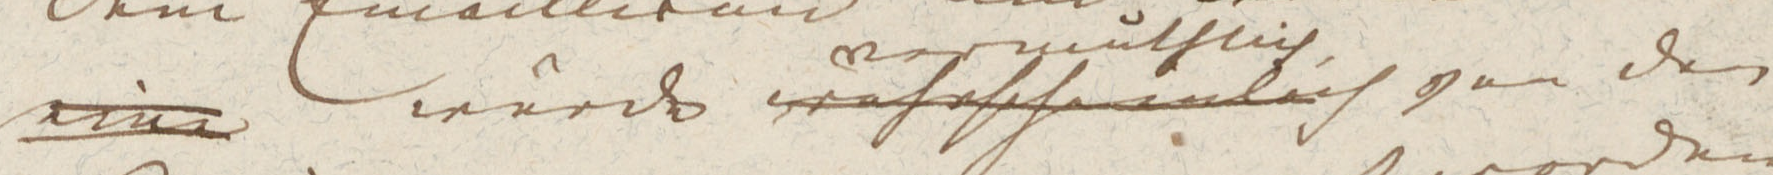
eine würde wahrscheinlich vermuthlich von den
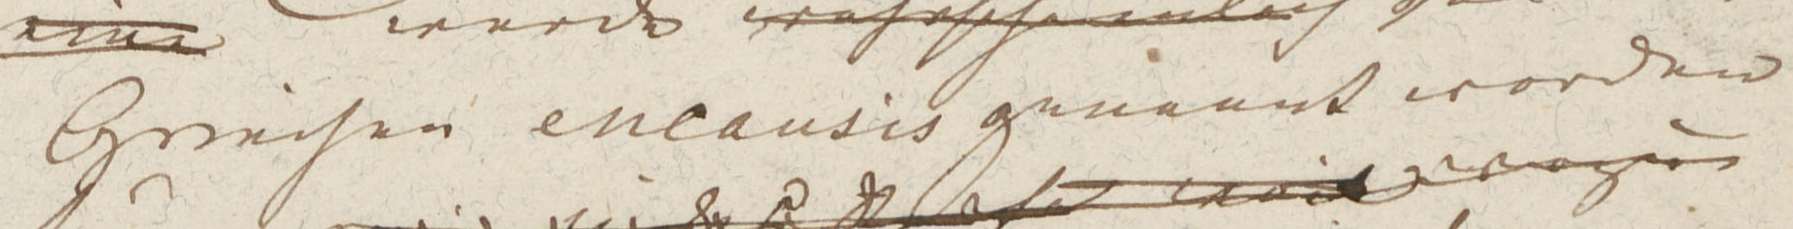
Griechen encausis genannt worden
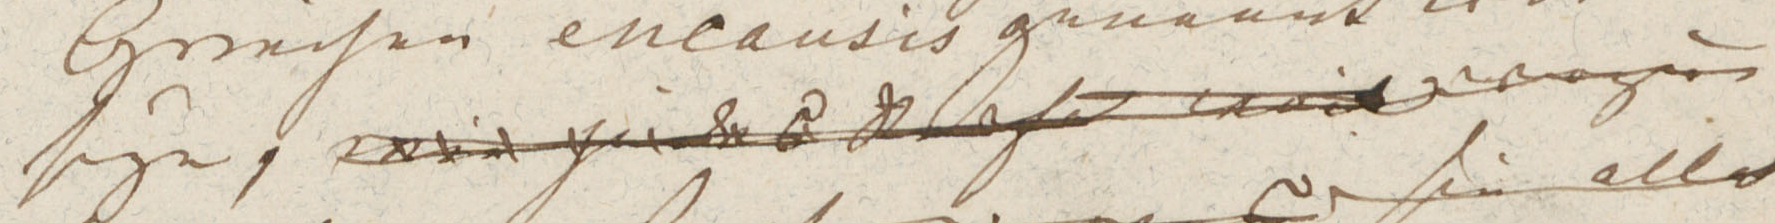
seyn, wie jedes Verfa weit wozu
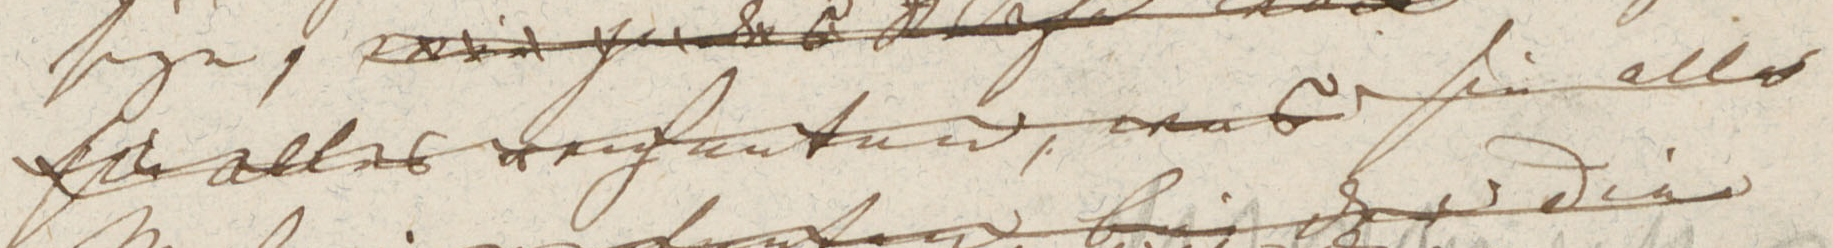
sie alles rechneten, was sie alle
